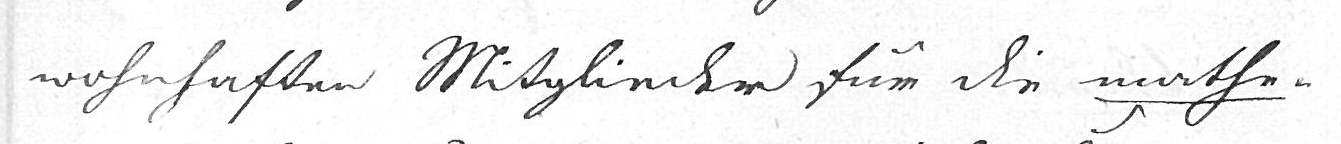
wohnhaften Mitglieder für die mathe-
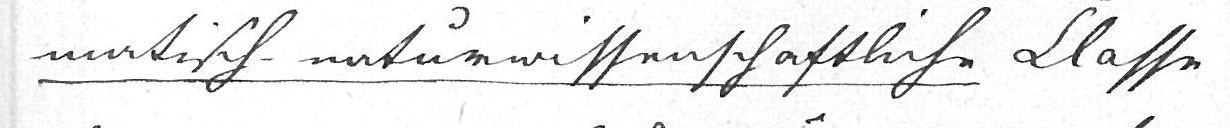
matisch-naturwissenschaftliche Classe.
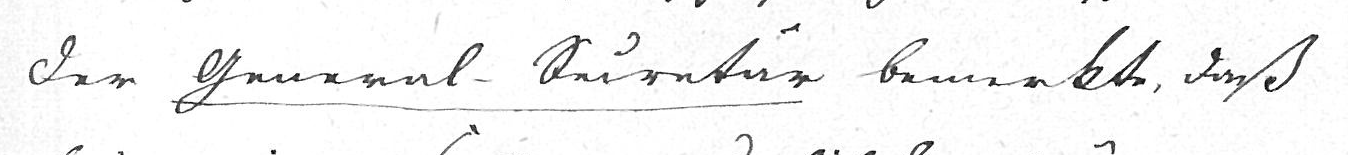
Der General-Secretär bemerkt, daß
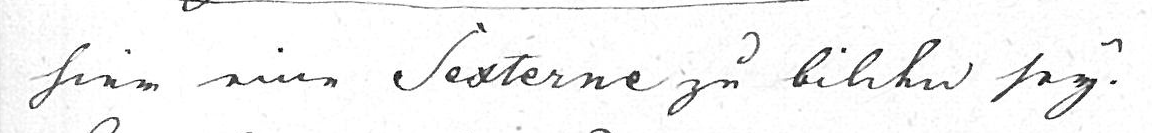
hier eine Sexterne zu bilden sey.
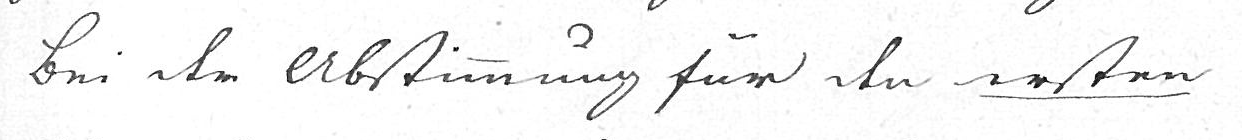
Bei der Abstimmung für den ersten
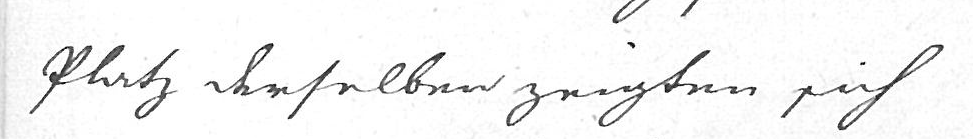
Platz derselben zeigten sich
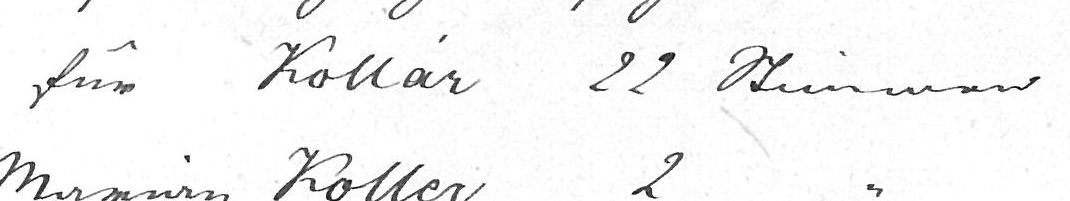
für Kollar 22 Stimmen
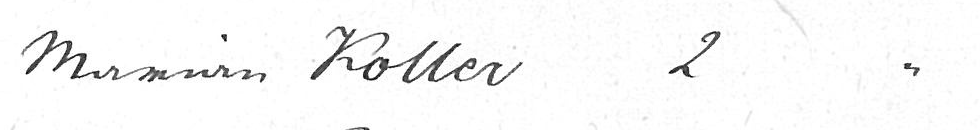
Marian Koller 2 "
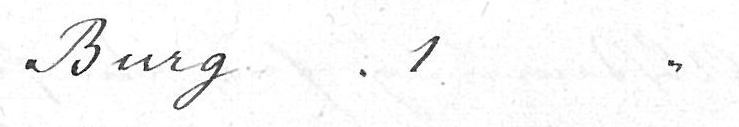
Burg 1 "
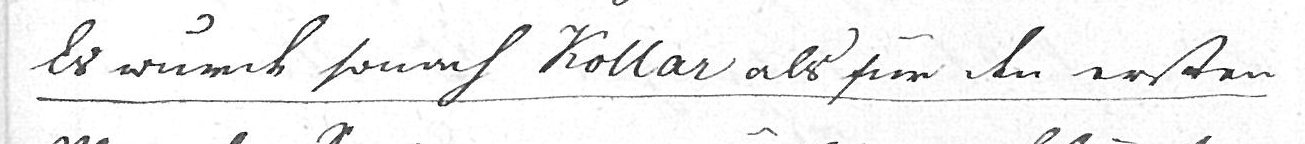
Es wurde sonach Kollar als für den ersten
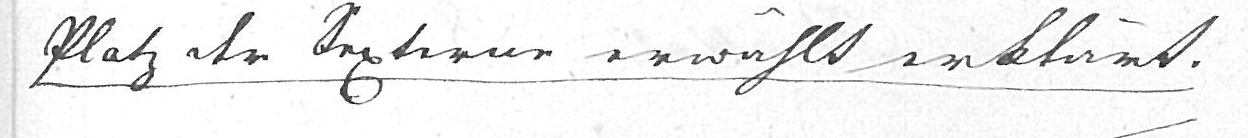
Platz der Sexterne erwählt erklärt.
